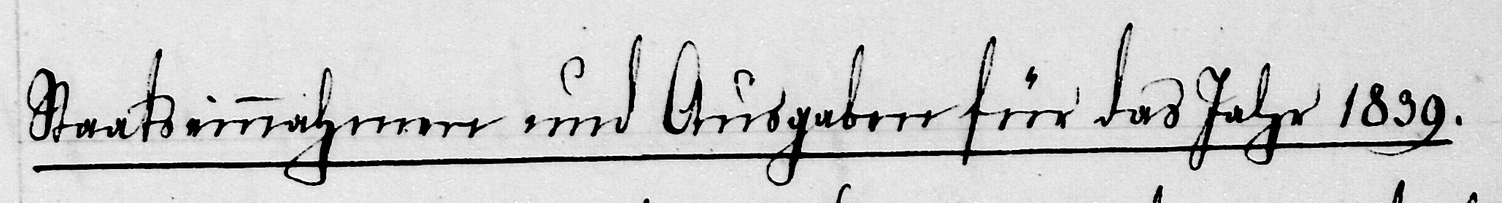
Staatseinnahmen und Ausgaben für das Jahr 1839.
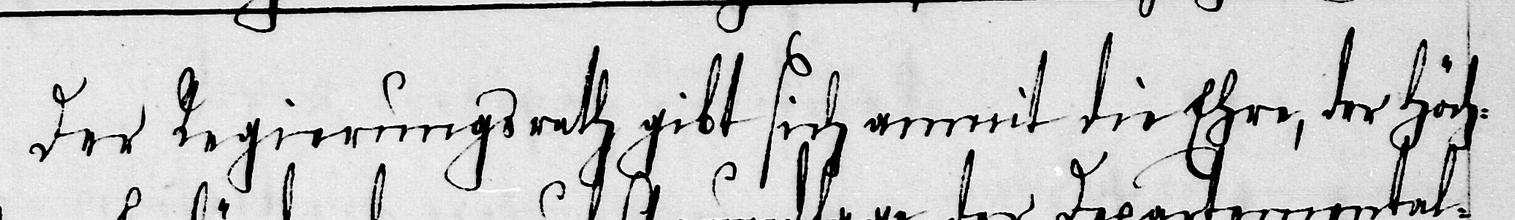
Der Regierungsrath gibt sich anmit die Ehre, der Höc¬
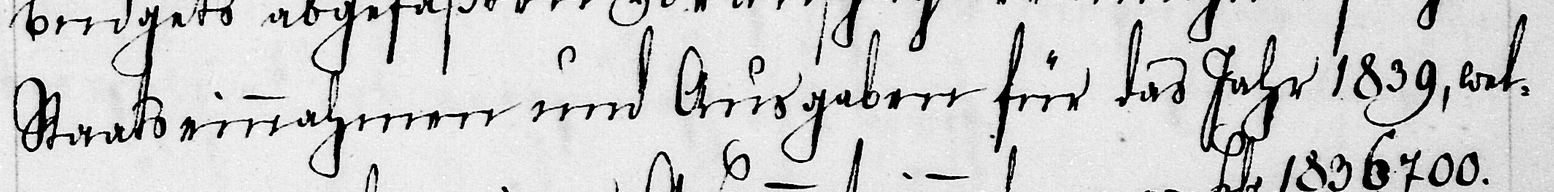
Staatseinnahmen und Ausgaben für das Jahr 1839, wel¬
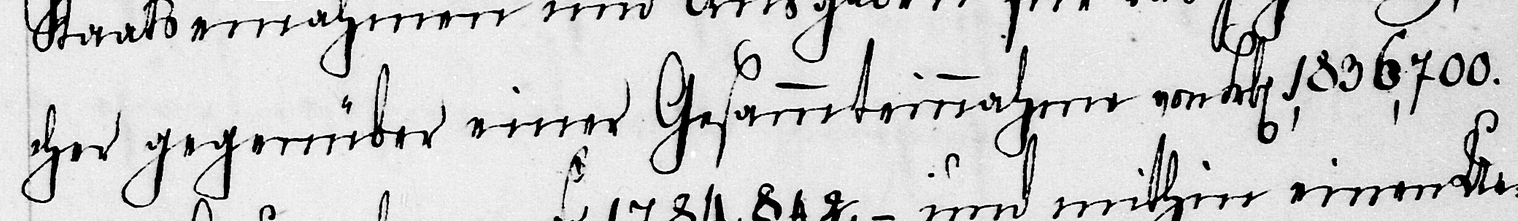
cher gegenüber einer Gesammteinnahme von Frk[en]. 1,836,700.
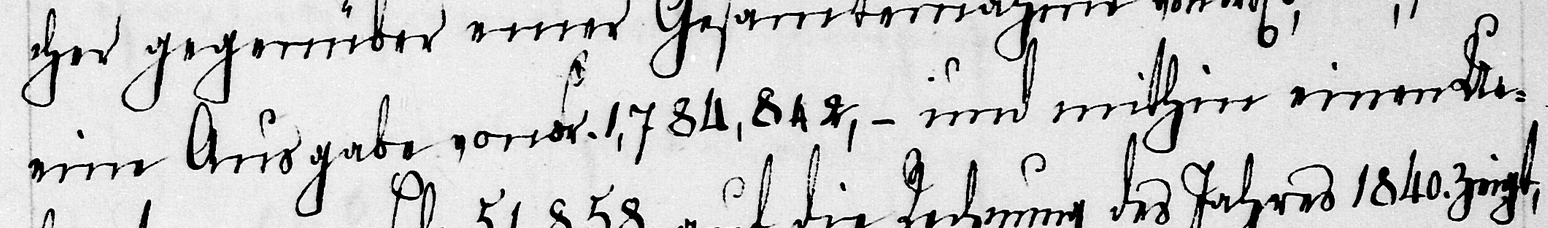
eine Ausgabe von Fr. 1,784,842, – und mithin einen Ue¬
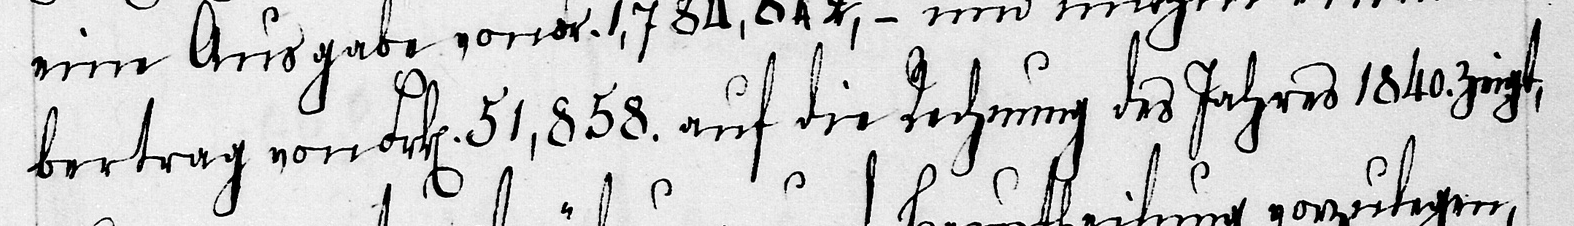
bertrag von Frk[en]. 51,858. auf die Rechnung des Jahres 1840. zeigt,
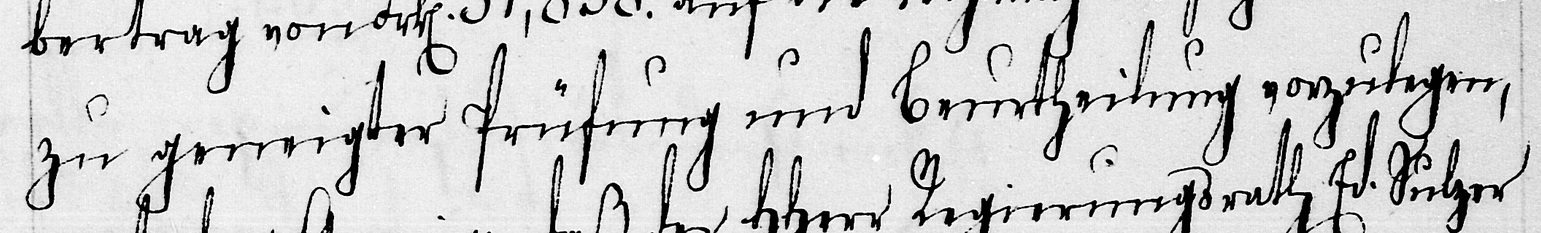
zu geneigter Prüfung und Beurtheilung vorzulegen,
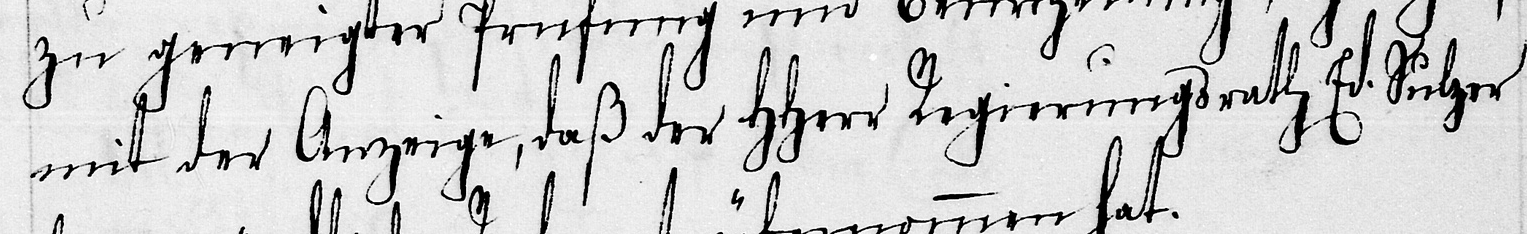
mit der Anzeige, daß der HHerr Regierungsrath Ed. Sulzer
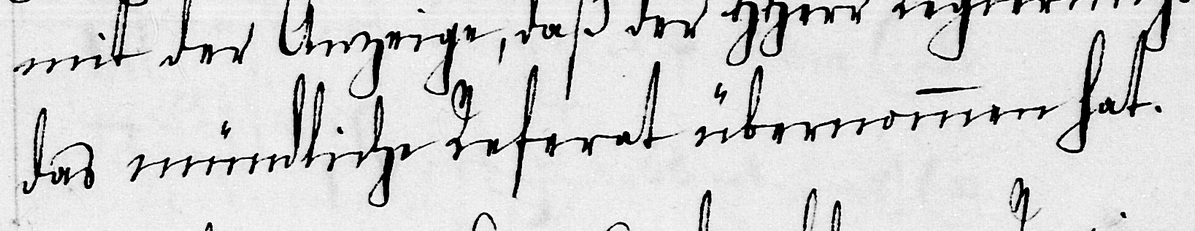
das mündliche Referat übernommen hat.
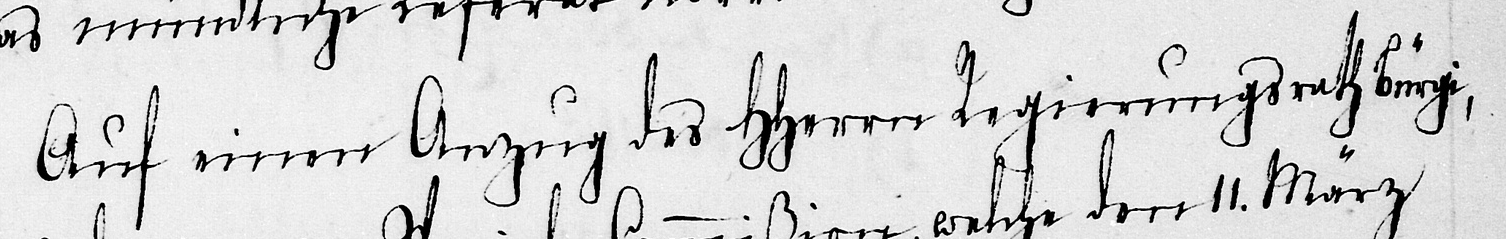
Auf einen Anzug des HHerrn Regierungsrath Bürgi,
